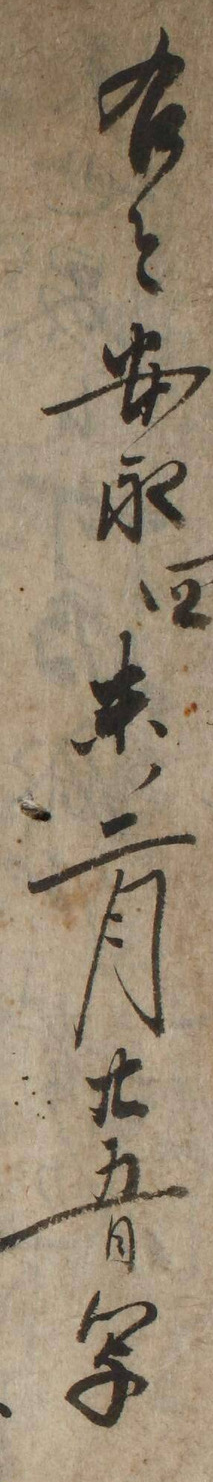右を安永四未の二月廿五日写
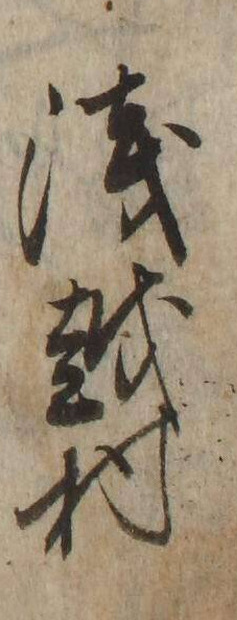浅越村
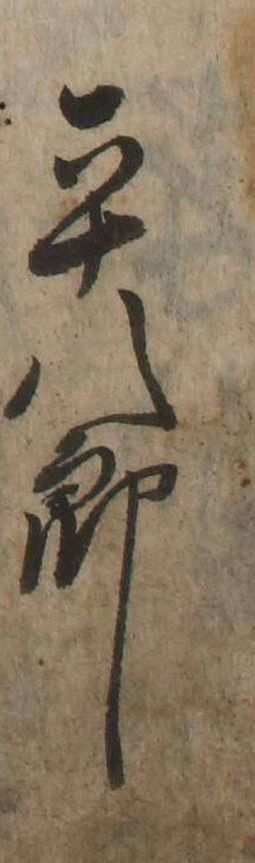平八郎
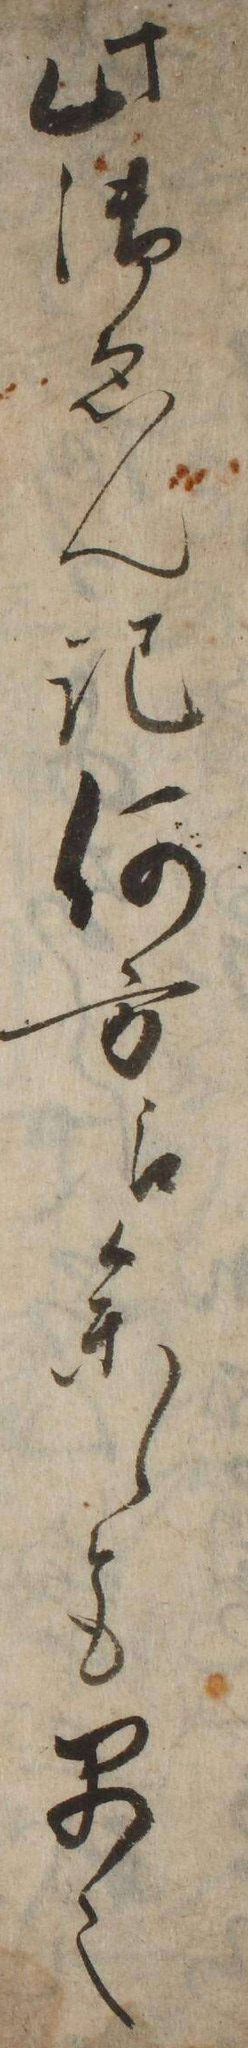此御ゑん記何方え参しとも早々
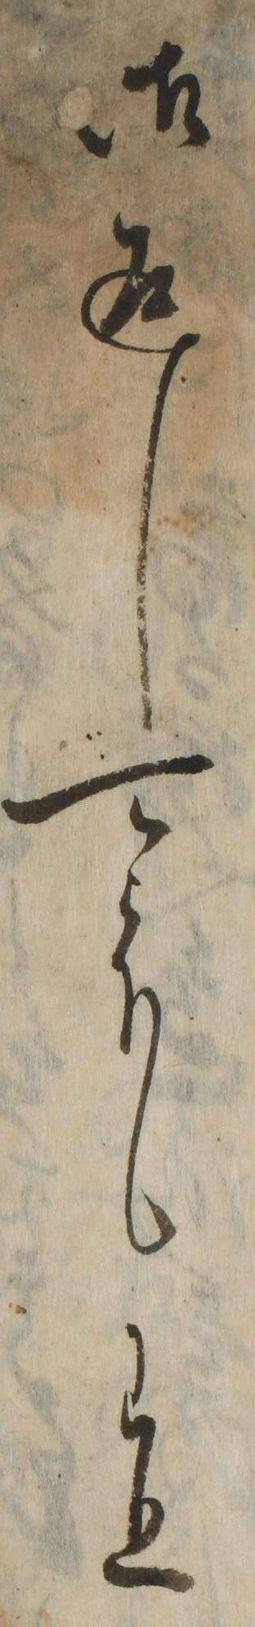御返し可被下候已上
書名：奉弘法大師御傳記
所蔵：国文学研究資料館
